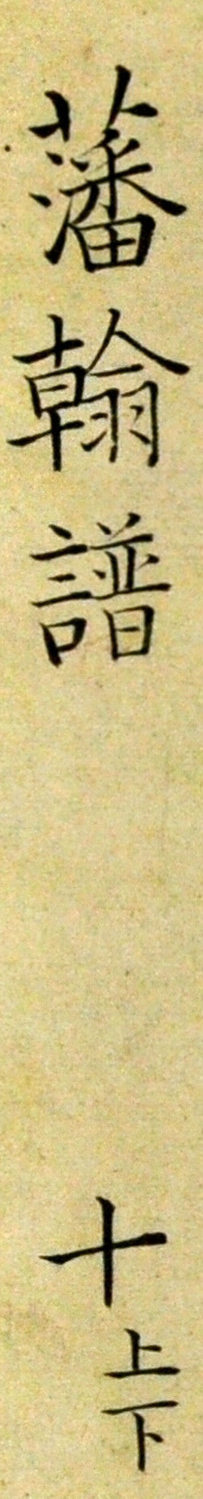藩翰譜十上下
